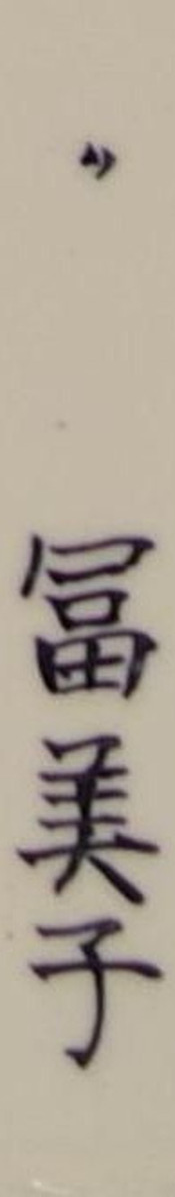冨美子
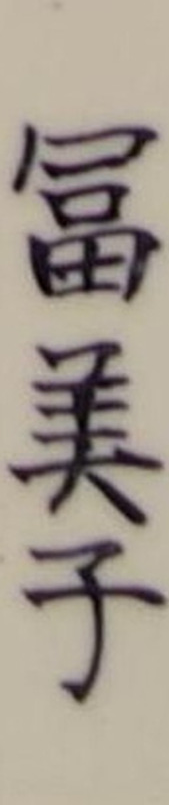冨美子
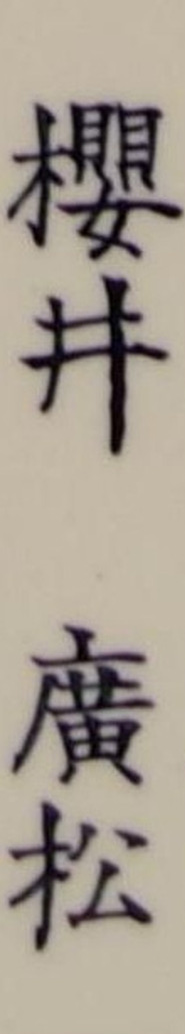桜井廣松
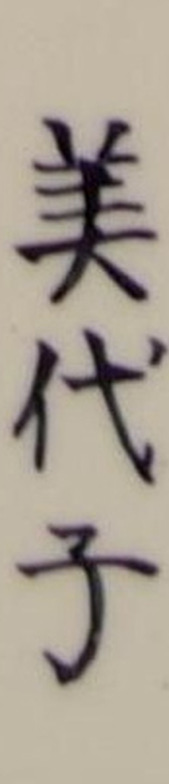美代子
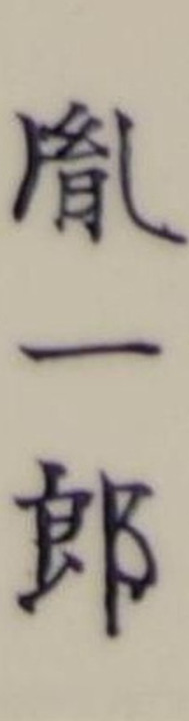胤一郎
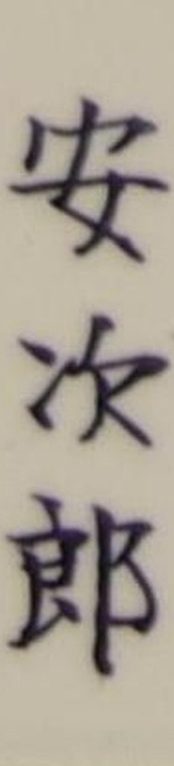安次郎

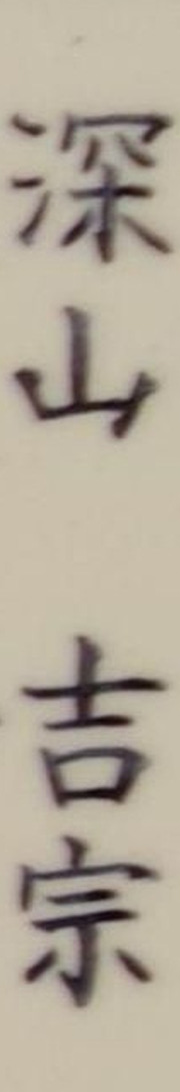深山吉宗
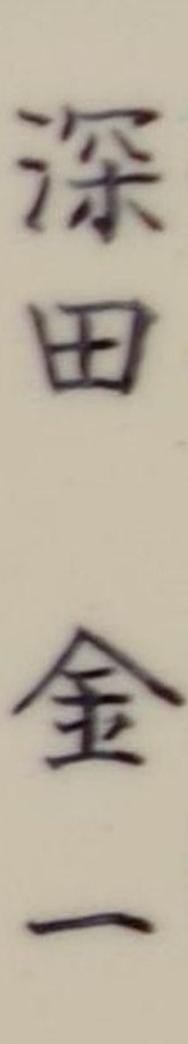深田金一
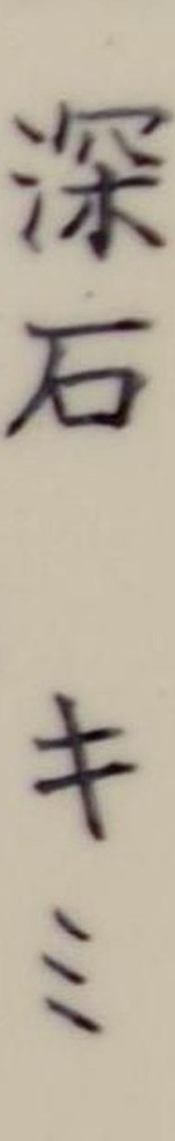深石キみ
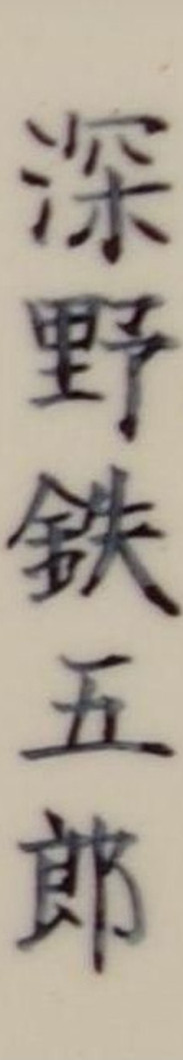深野鉄五郎
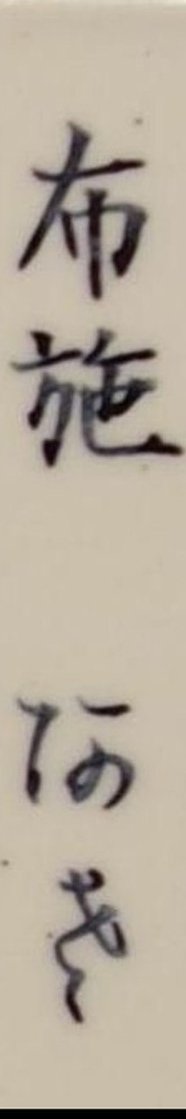布施あさ
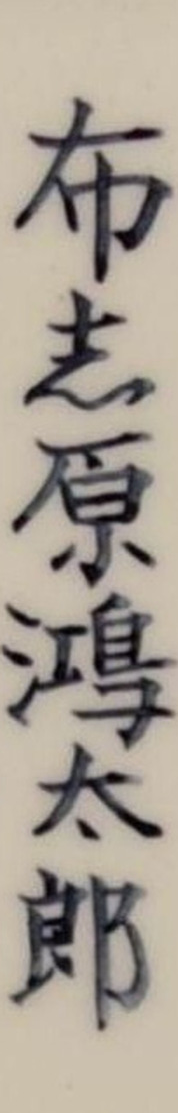布志原鴻太郎
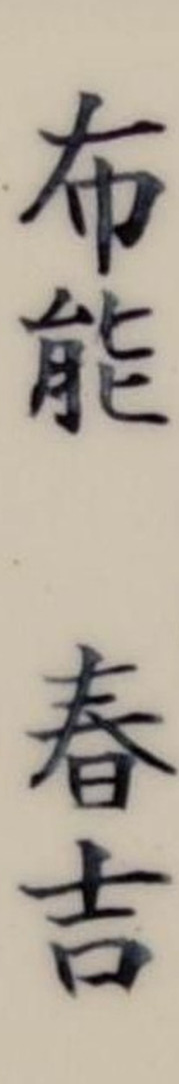布能春吉
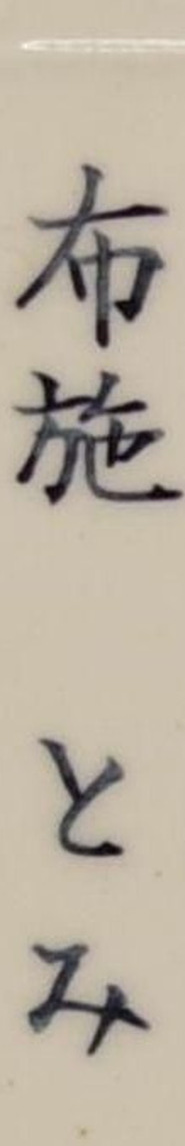布施とみ
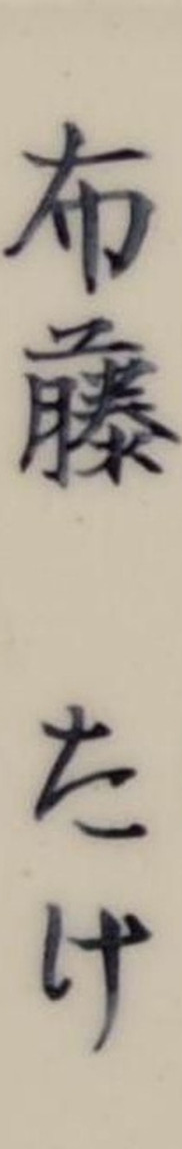布藤たけ
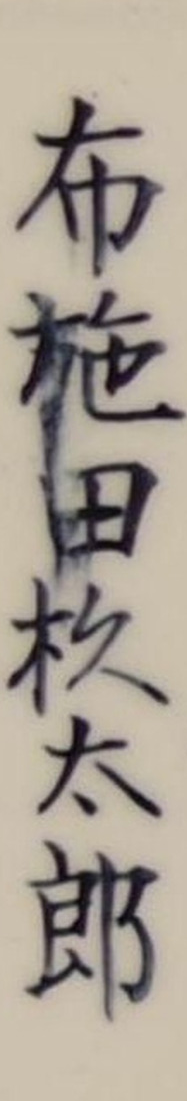布施田杉太郎
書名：E~L
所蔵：高野山金剛峯寺
